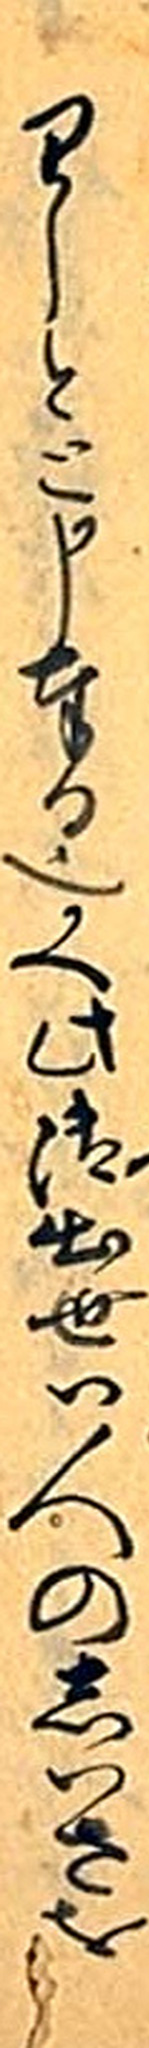りしとと申奉る也又此御出世は人のしはさを
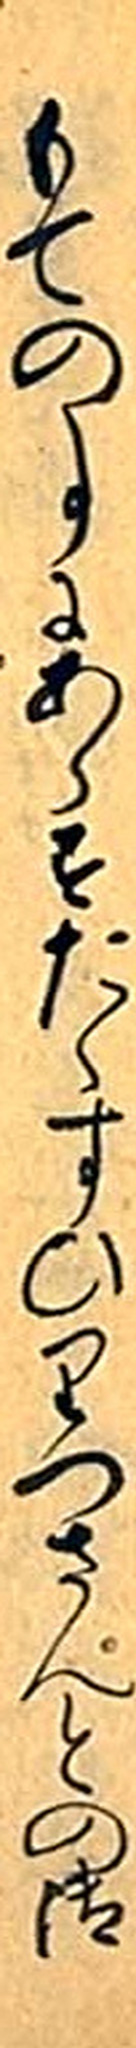もての事にあらすたゝすひりつさんとの御
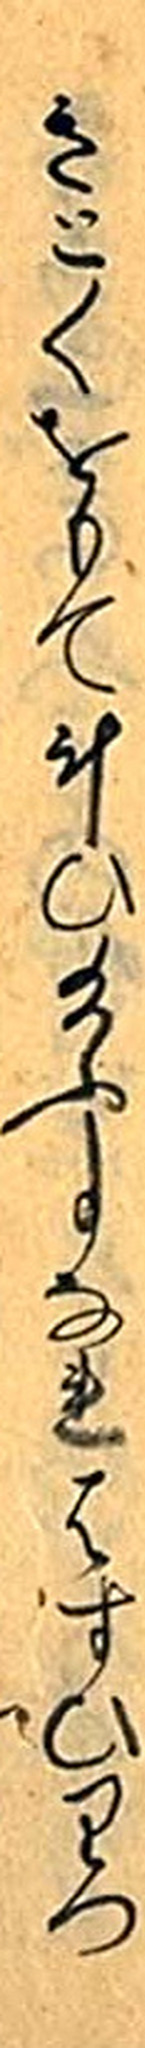きとくをもて計ひ給ふ事なれはすひりつ
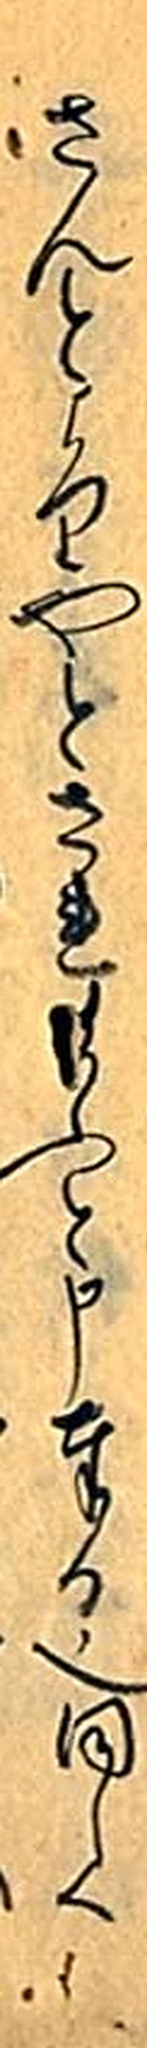さんとよりやとされふと申奉る也同しく
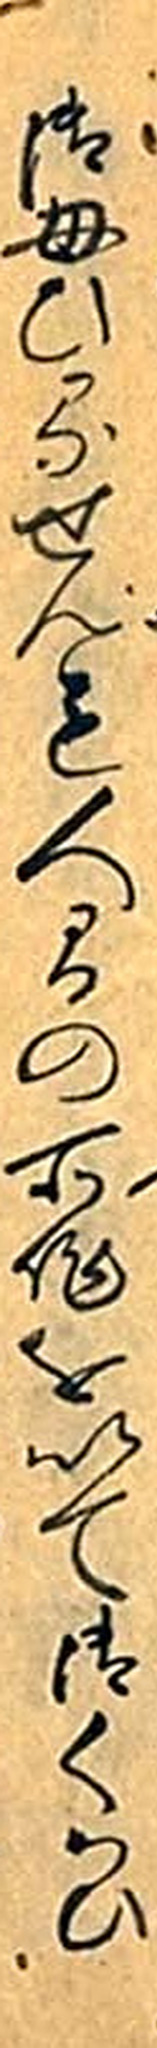御母ひるせんも人間の所作を以て御くはひ
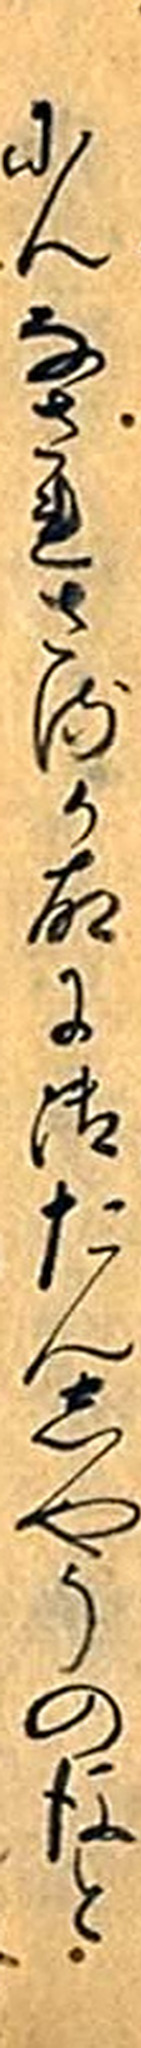にんなされさるか故に御たんしやうの後と
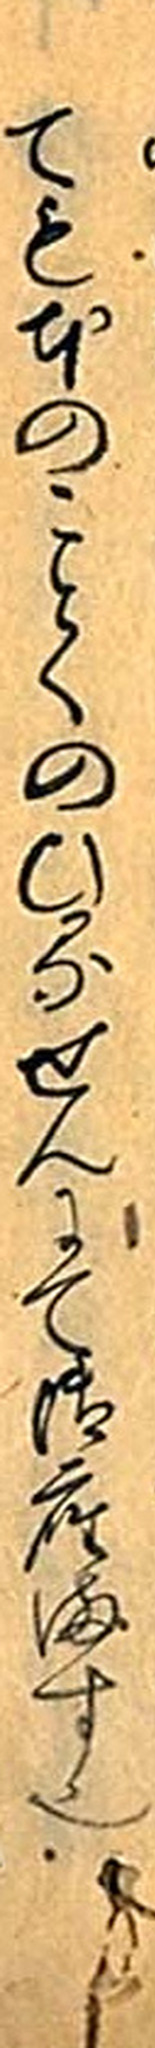ても本のことくのひるせんにて御座ます也
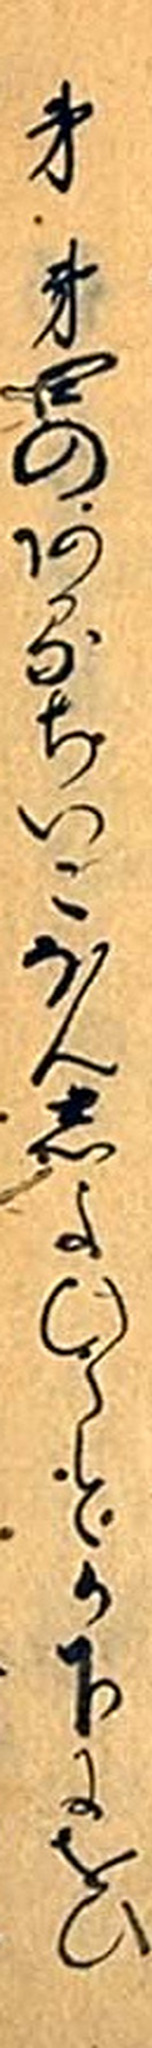弟第四のあるちいこほんしよひらとか下にをひ
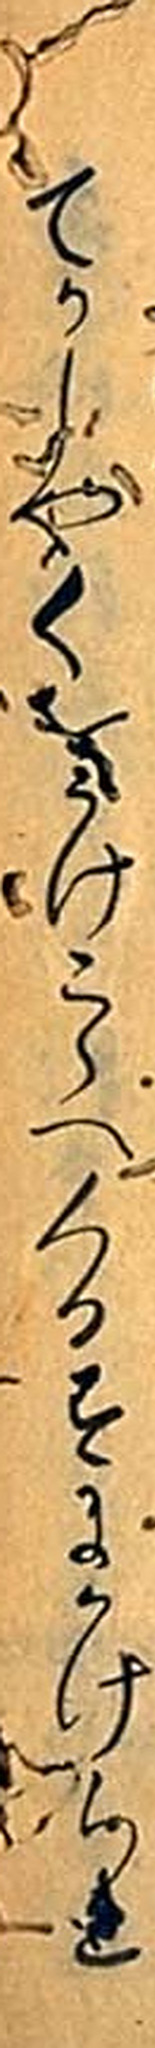てかしやくをうけこらへくるすにかけられ

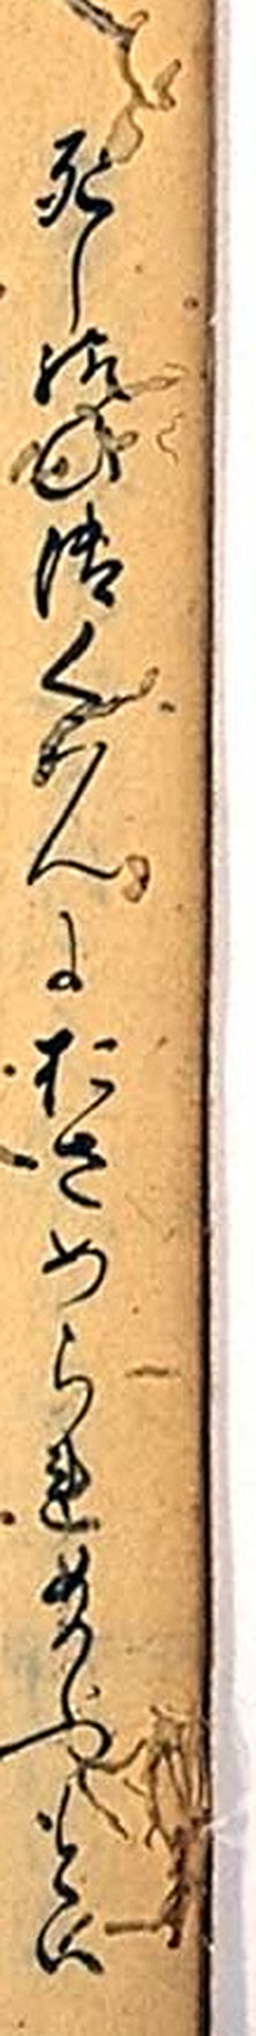死し給ひ御くはんにおさめられ給ふとは
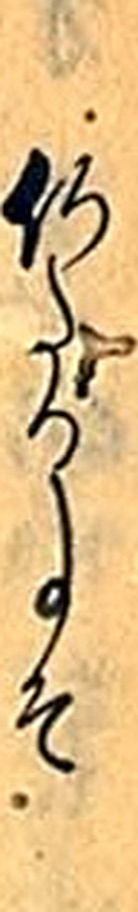何たる事そ
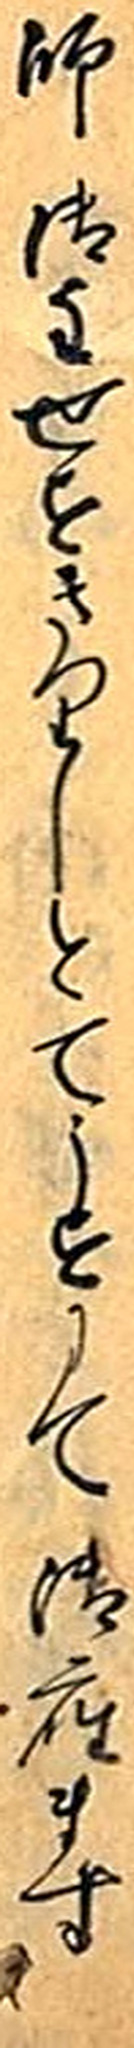師御主せすきりしとてうすにて御座ます
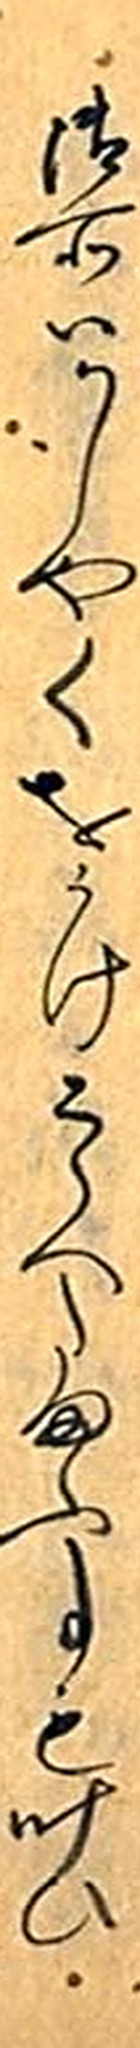御所はかしやくをうけこらへたまふ事も叶ひ
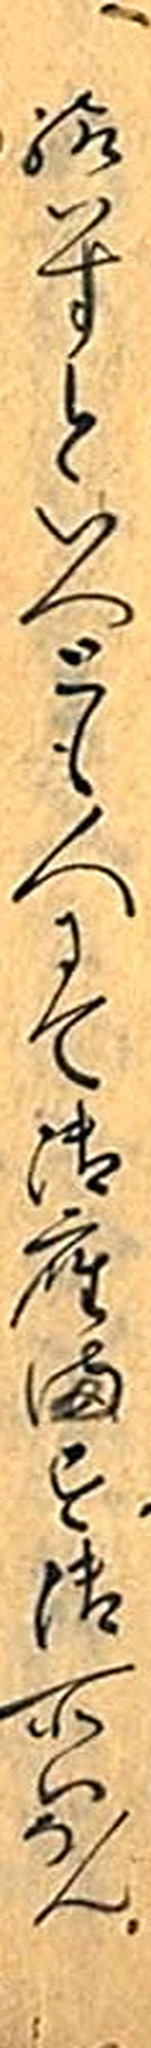給はすといへとも人にて御座ます御所はほん
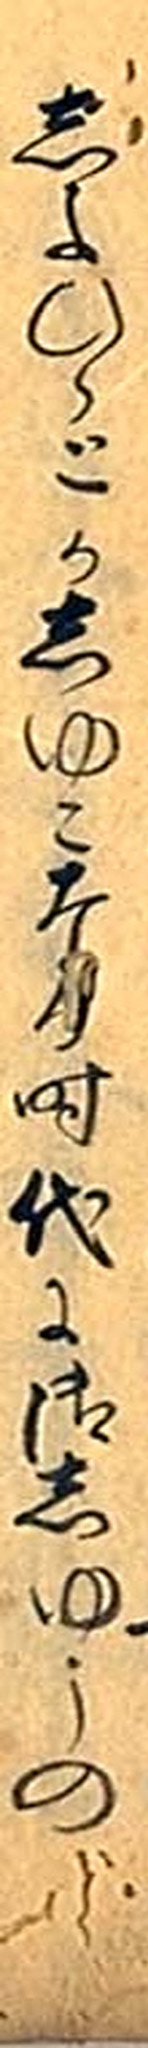しよひらとかしゆこなる時代に御しゆうの
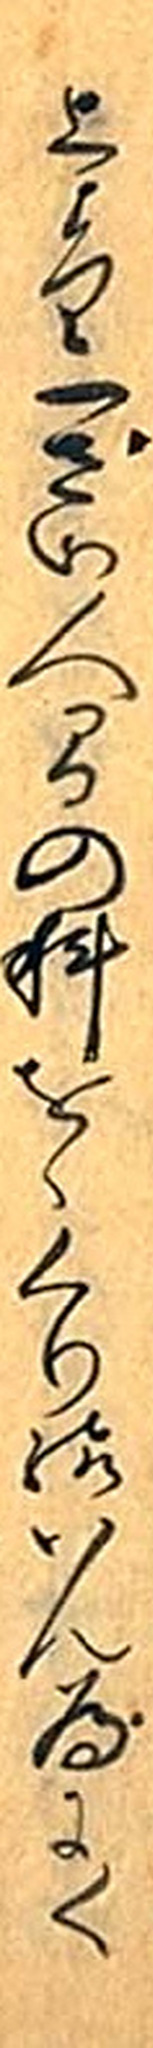上より一さい人間の科をゝくり給はん為にく
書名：ドチリナ・キリシタン
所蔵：東京大学総合図書館 / General Library in the University of Tokyo
